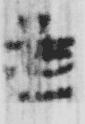必
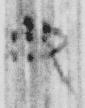又
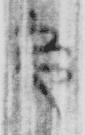夫
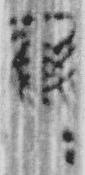戀戀
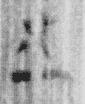之
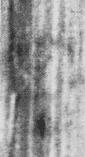哀
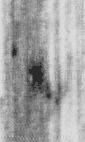凡
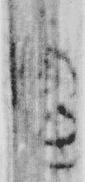悅
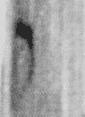人
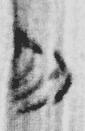勿
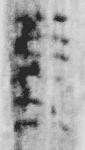○（隱）
